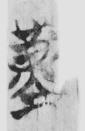難
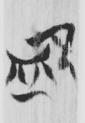卹
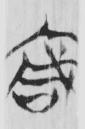{宀咸}
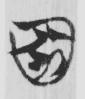圂
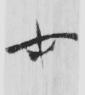才
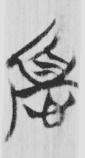𢝊
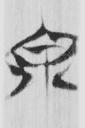余
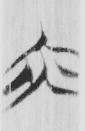亦
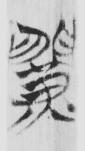{門黃}
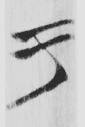于
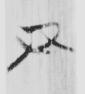四
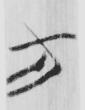方
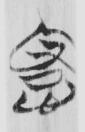{宏心}
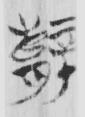{𡴎辛月}
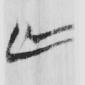亡
